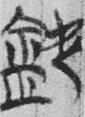欽（感）
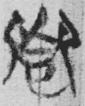卿（亨）
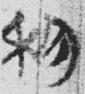利
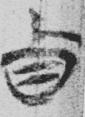貞
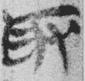取
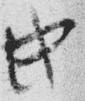女
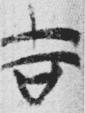吉
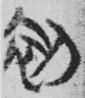初
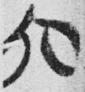六
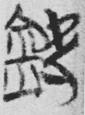欽（感）
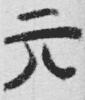亓（其）
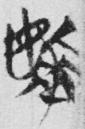拇
